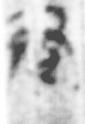君
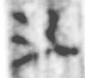之
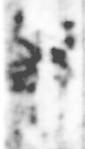○（畋）
